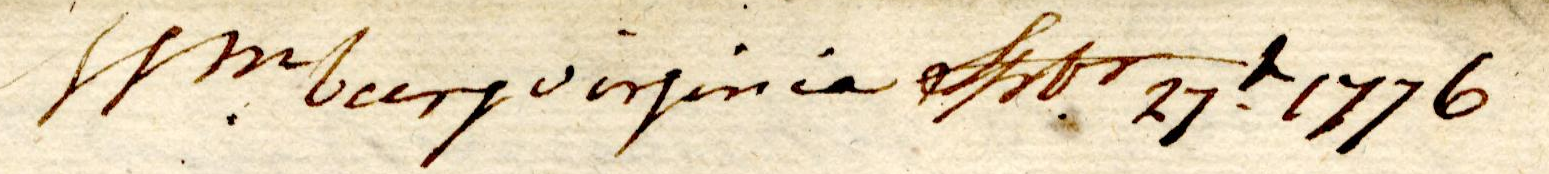W^m.burg virginia Spb^r 27^t 1776
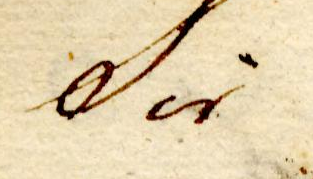Sir
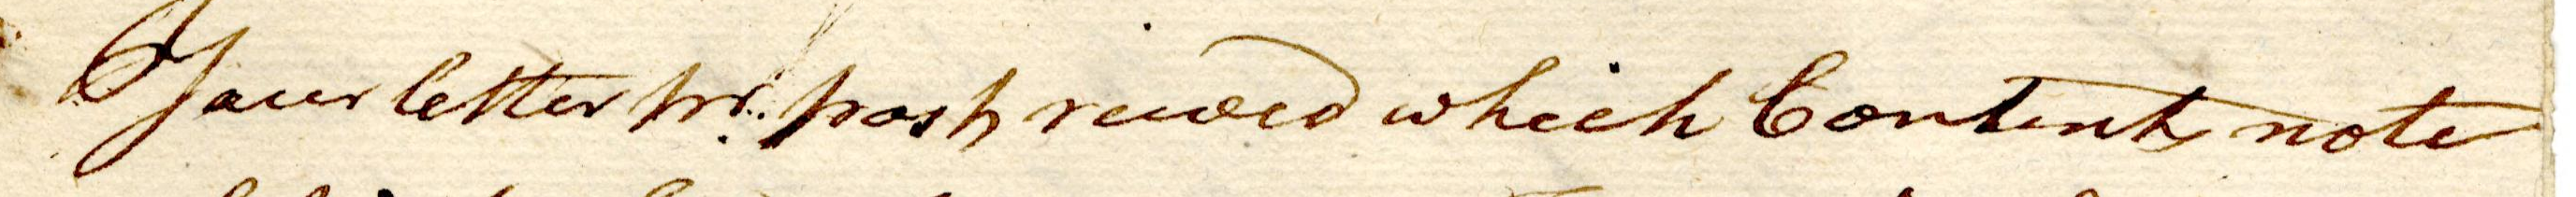Your letter p^r post receved which Contents note
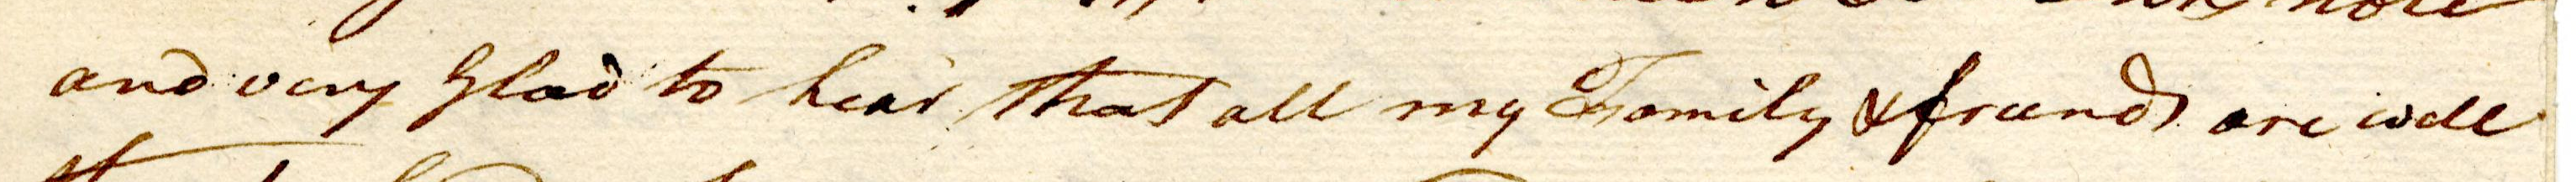and very glad to hear that all my Family & friends are well
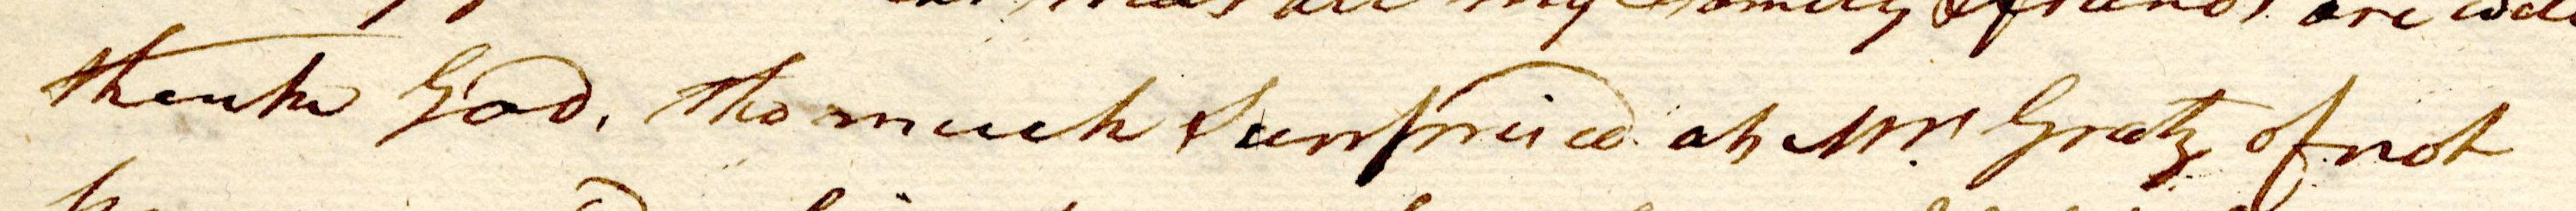thank God, tho much surprised at M^rs. Gratz of not
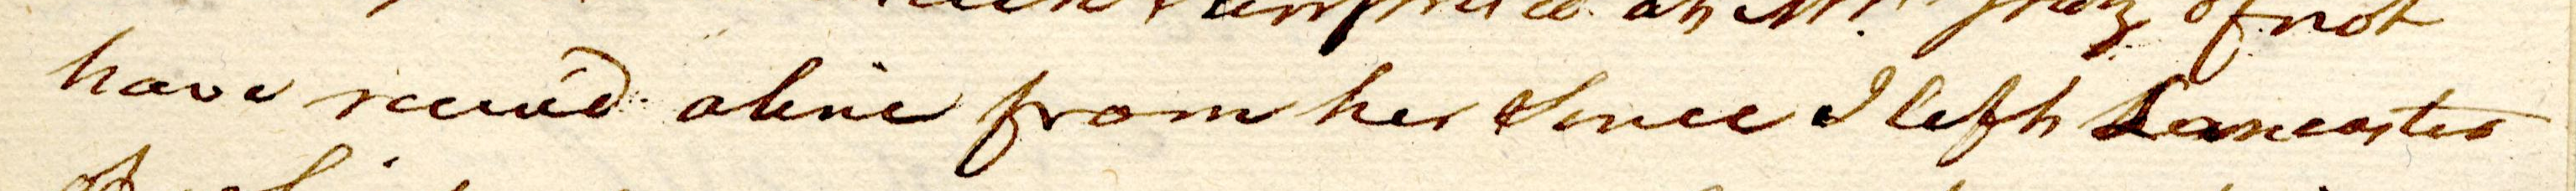have receved a line from her since I left Lancaster
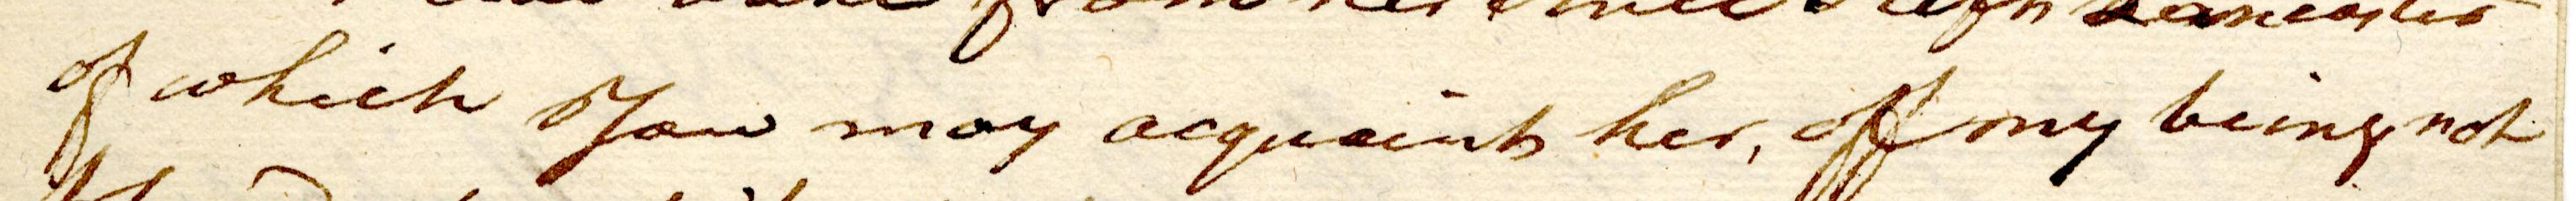of which you may acquaint her, off my being not
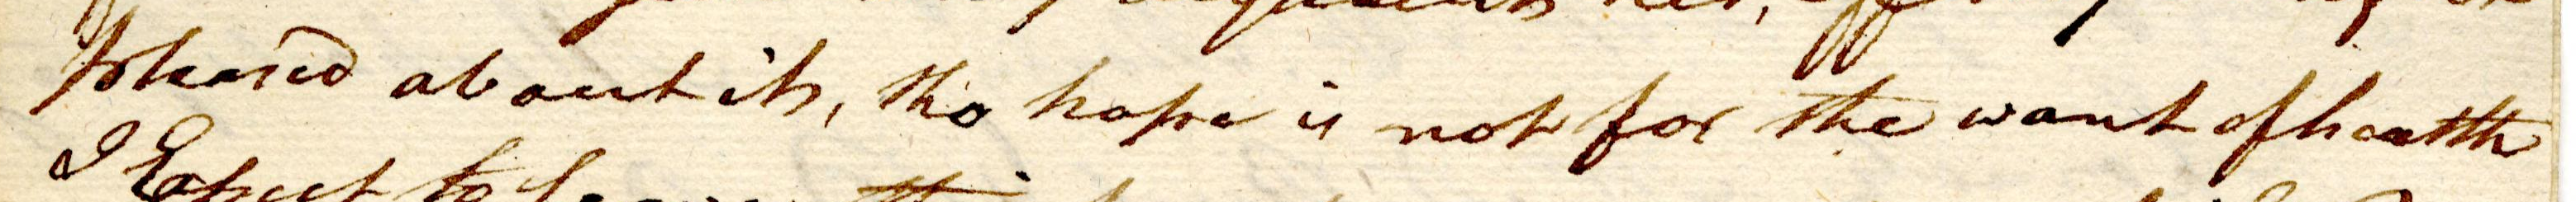pleased about it, tho hope is not for the want of health
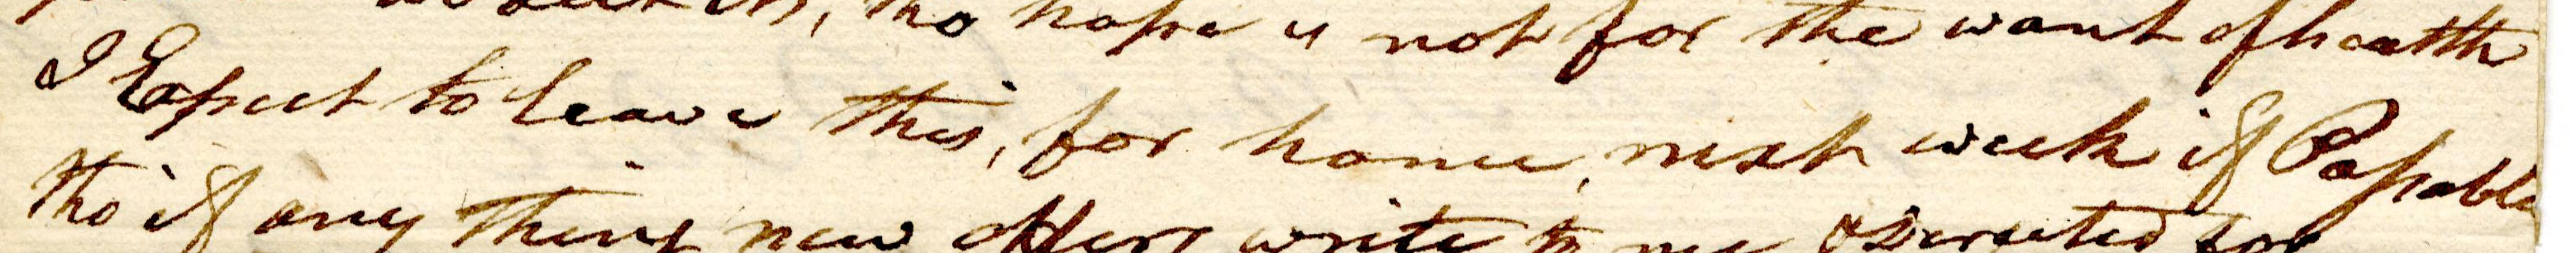I Expect to leave this for home next week if Possable
